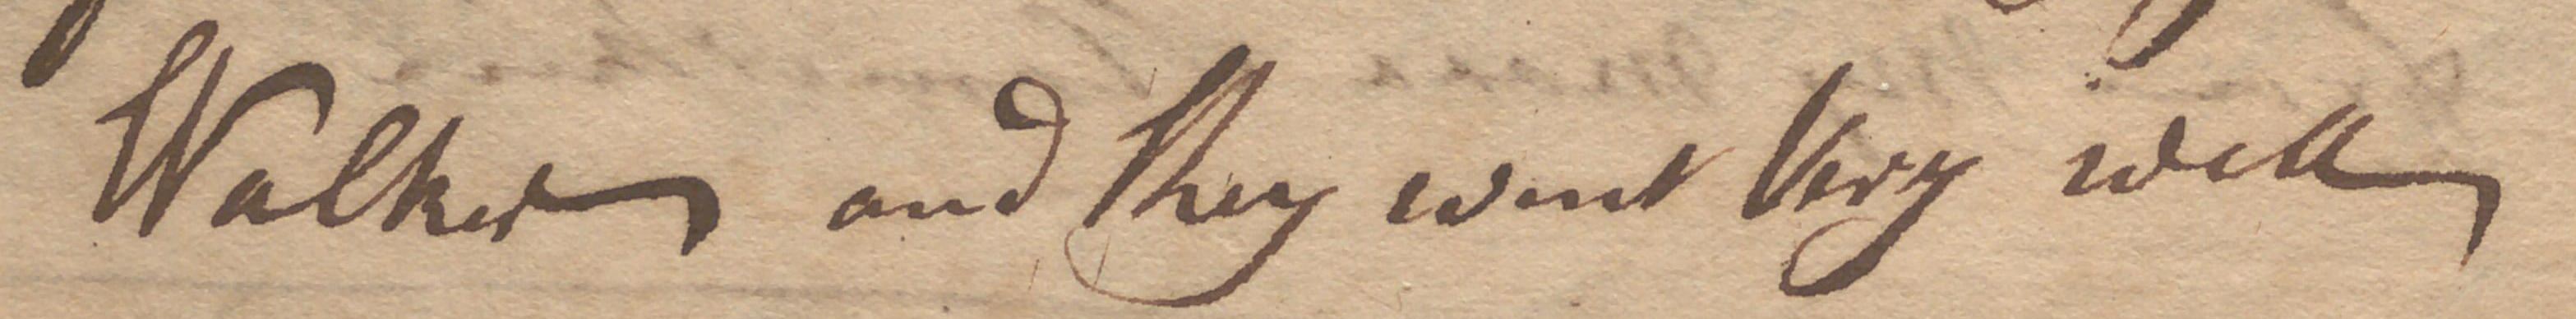Walker and they went Very well
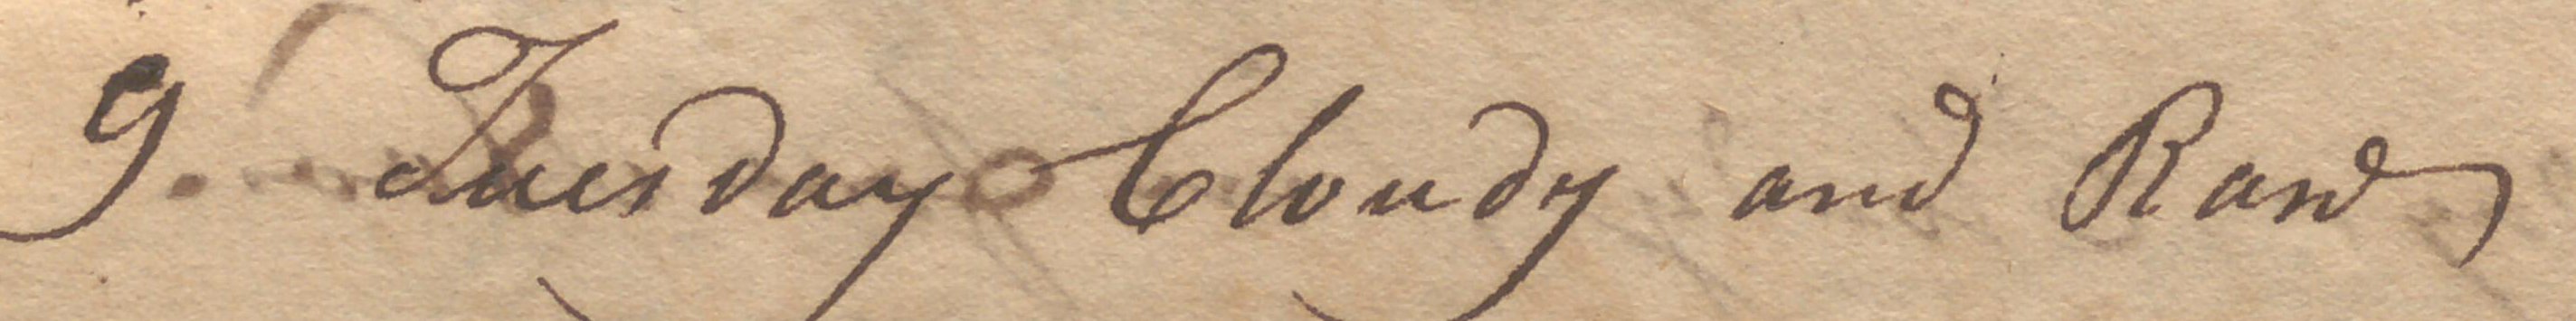9 Tuesday Cloudy and Raw
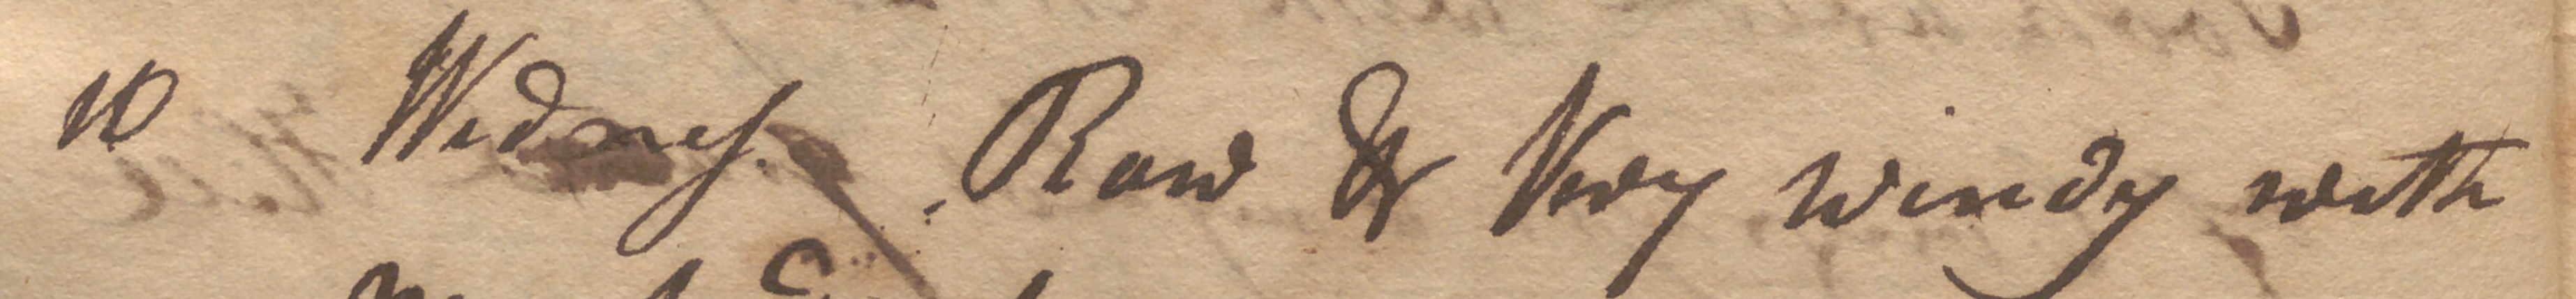10 Wednes Rew & Very windy with
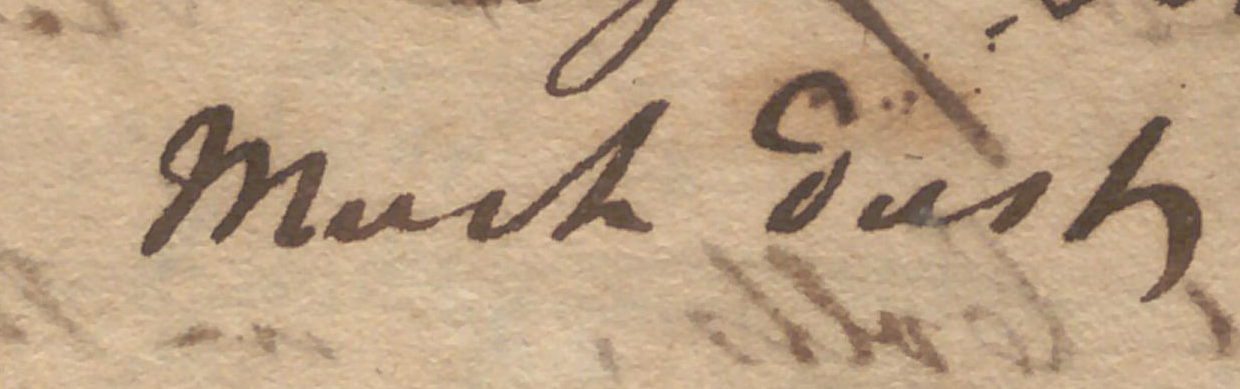Much dust
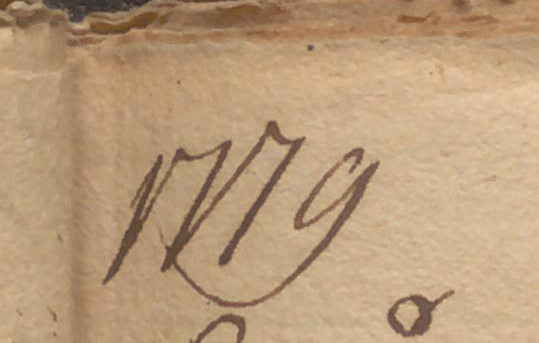1779
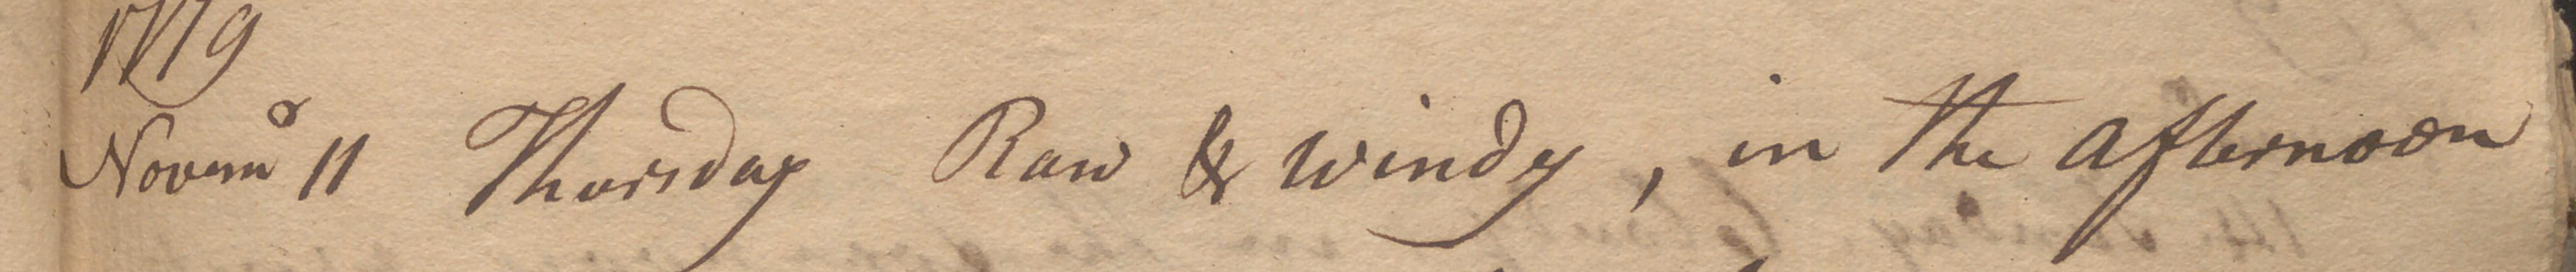Novem^r 11 Thursday Raw & windy, in the afternoon
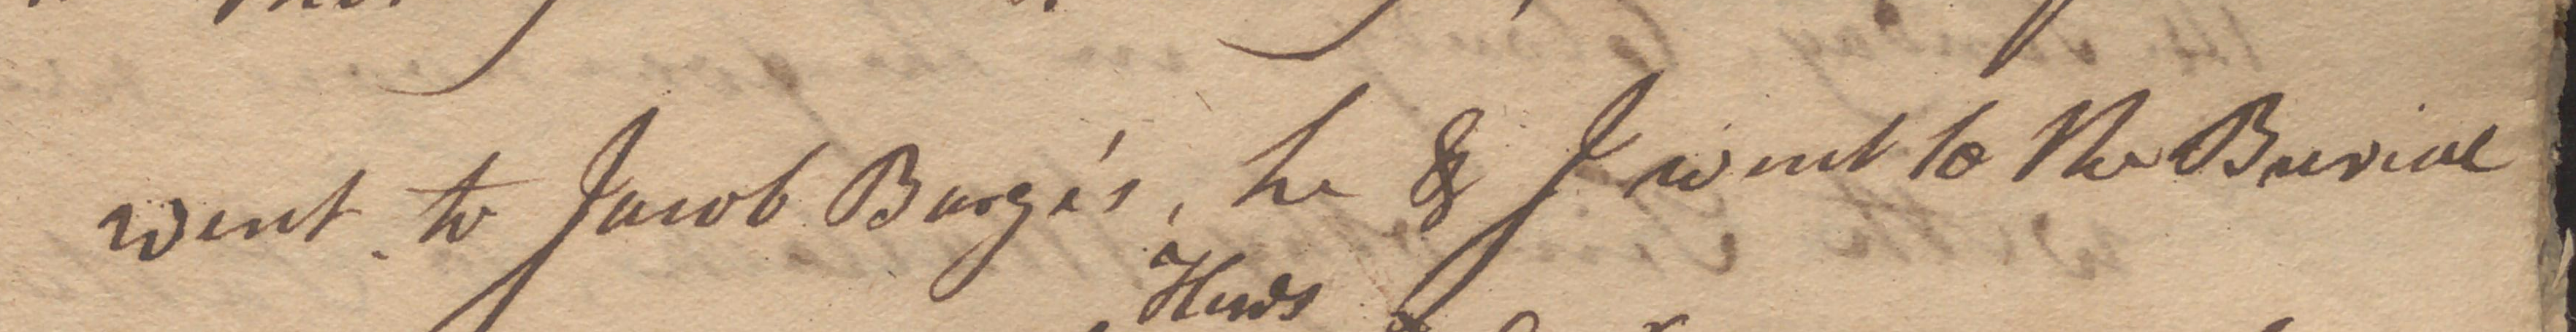went to Jacob Barge's, he & I wert to the Burial
